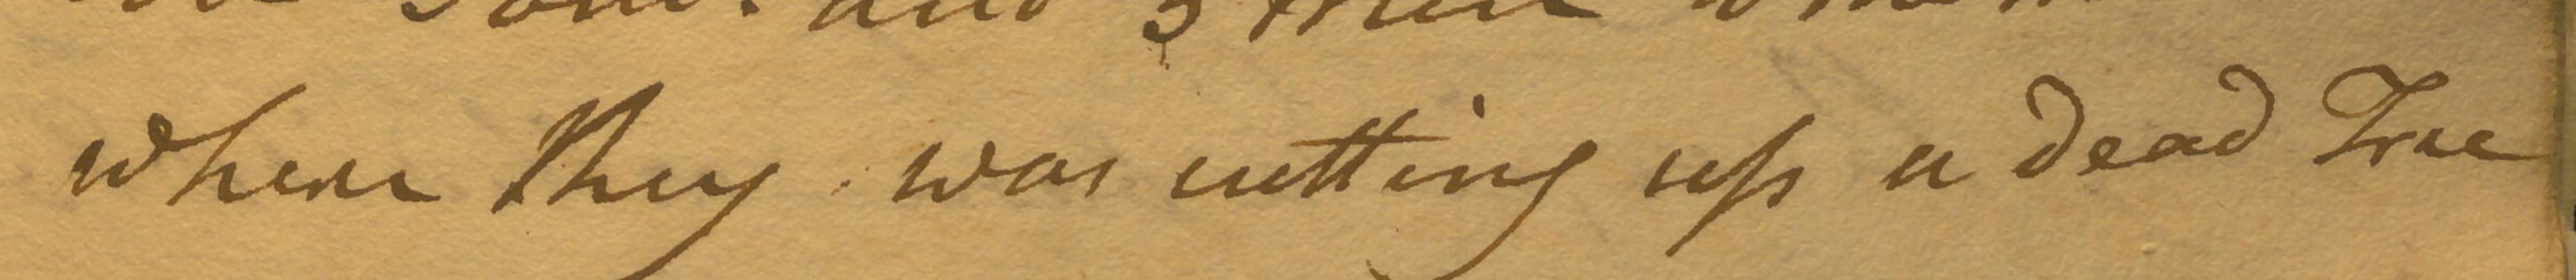where they was cutting up a dead Tree
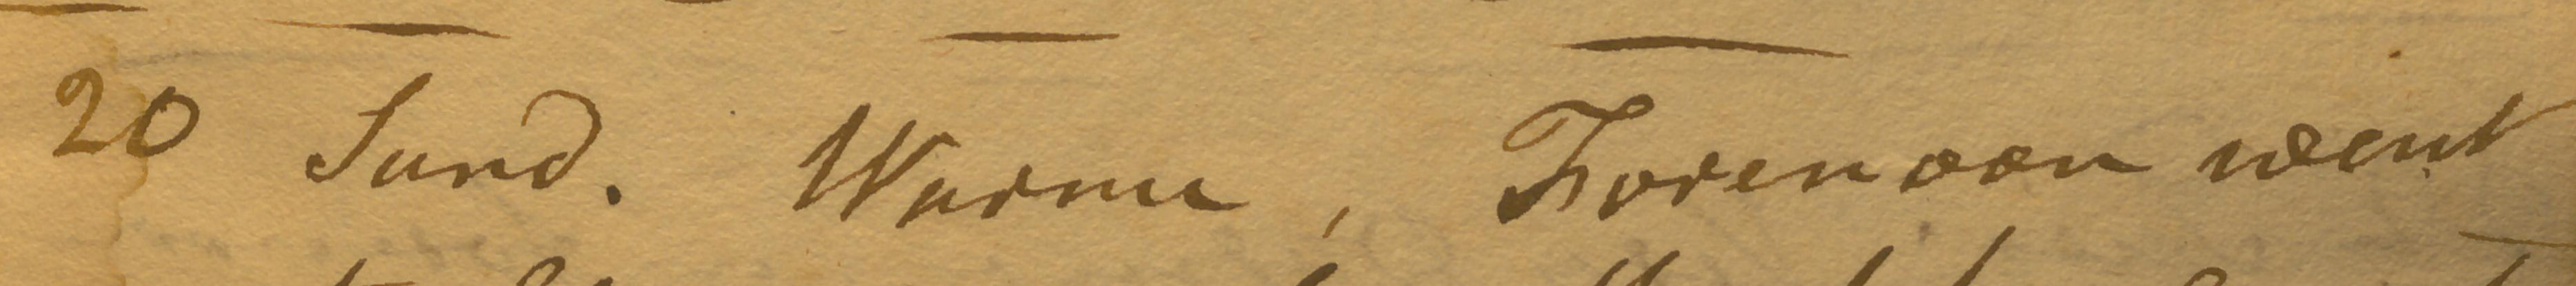20 Sund. Warme, Forenoon went
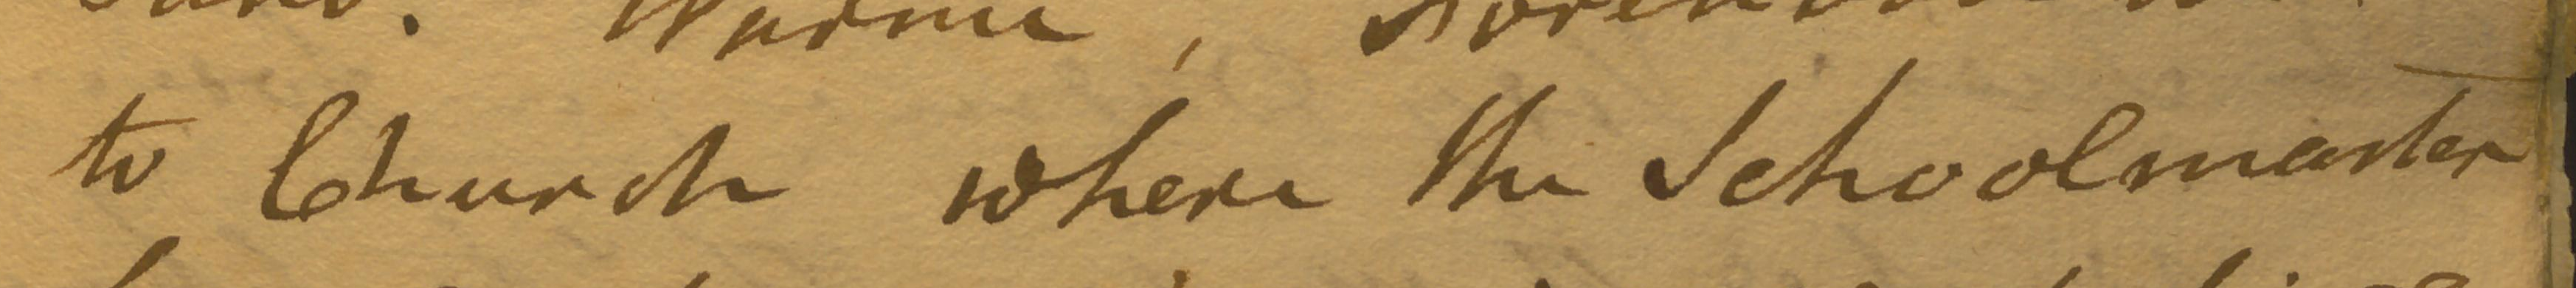to Church where the Schoolmaster
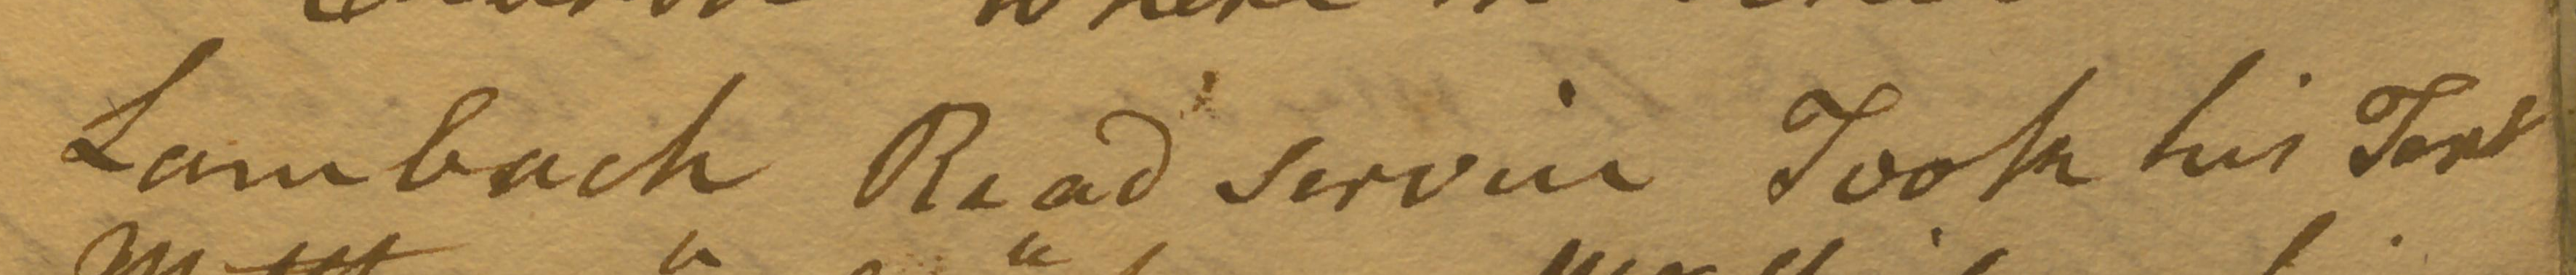Lamback Read servin Took his Ter
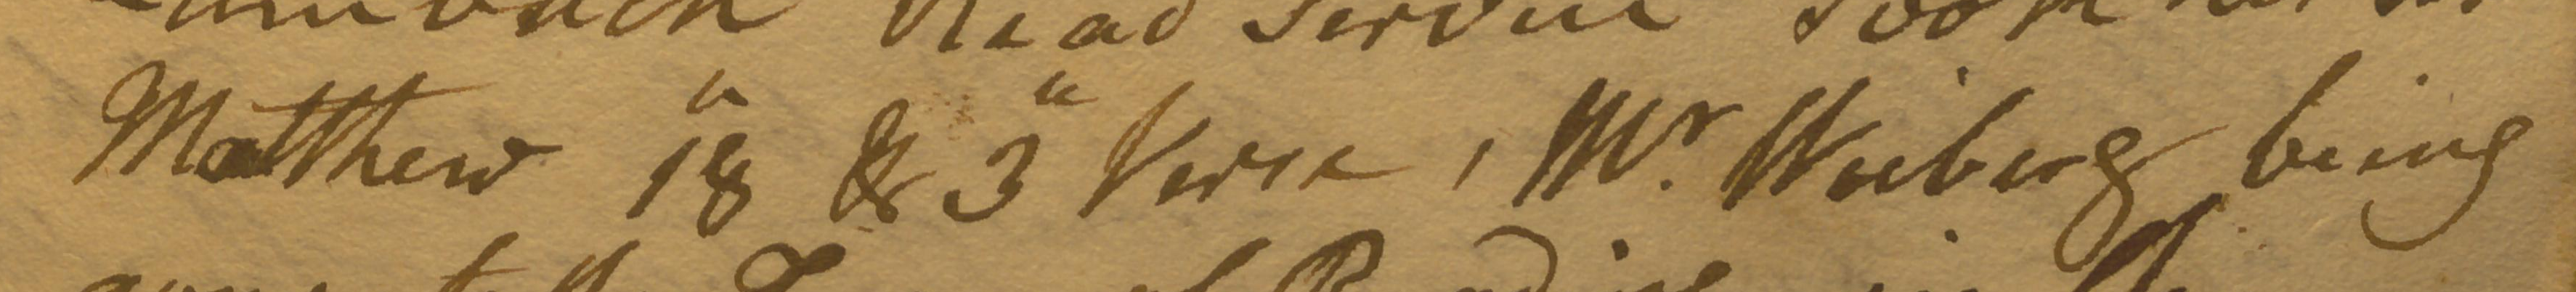Matthew 18^th & 3^th Verse, M^r. Weiberg being
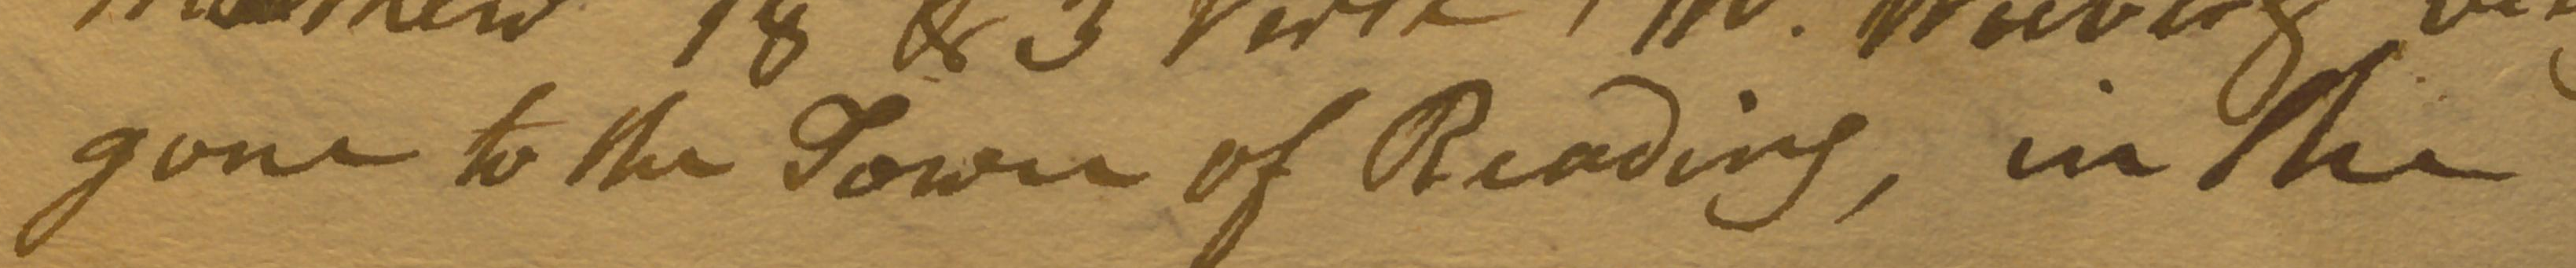gone to the Town of Reading, in the
